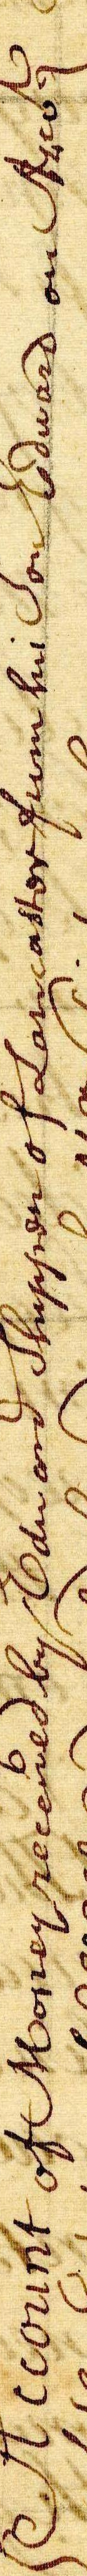Account of Money received by Edward Shippen of Lancaster frm his Son Edward on Acco^t
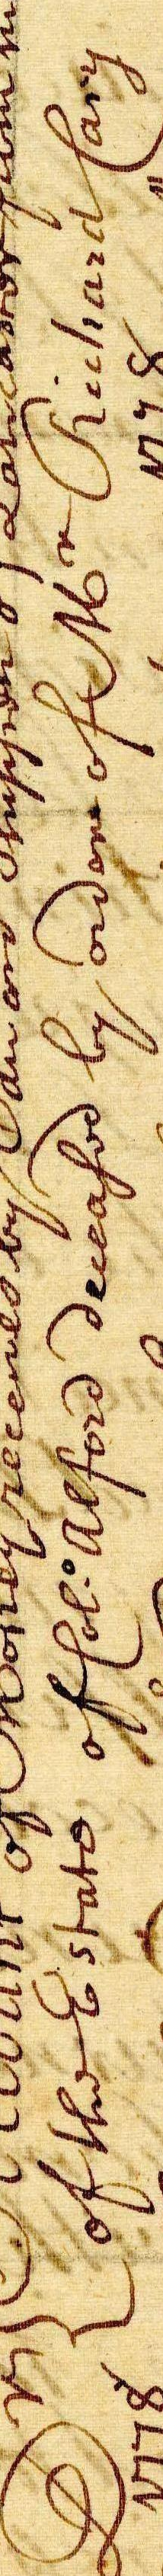D^r of the Estate of Col^o. Alford deceased by order of M^r Richard Cary
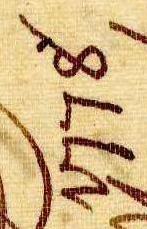1778
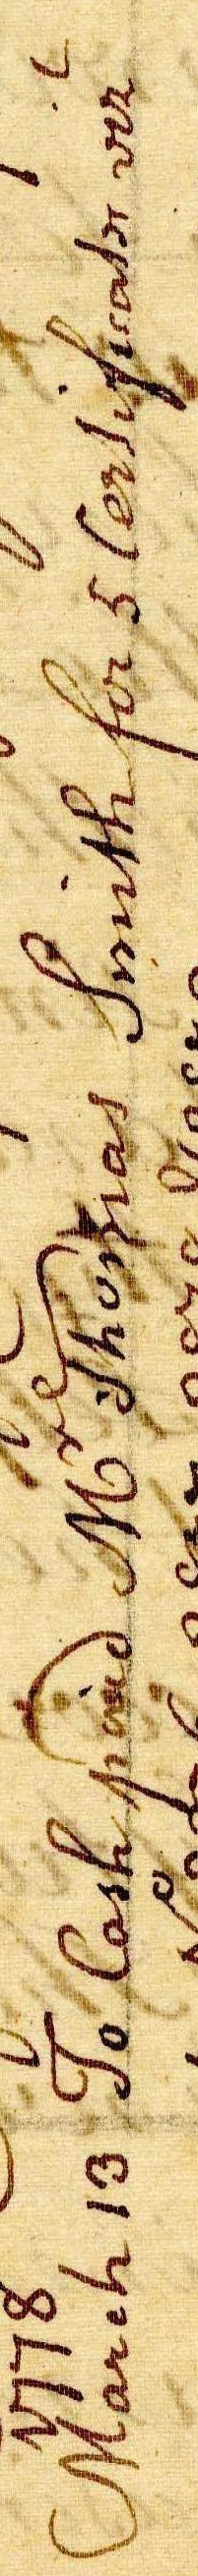March 13 To Cash paid M^r Thomas Smith for 5 Certificates viz^t
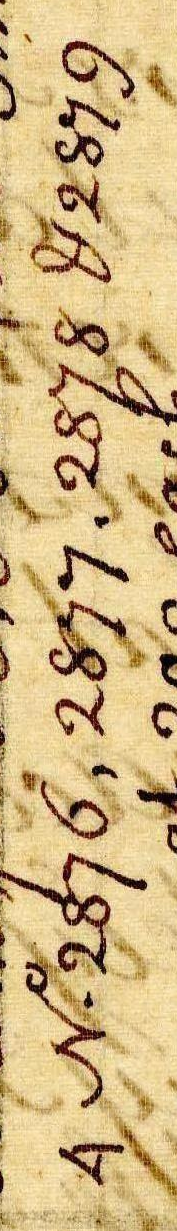4^ N^o. 2876, 2877. 2878 & 2879
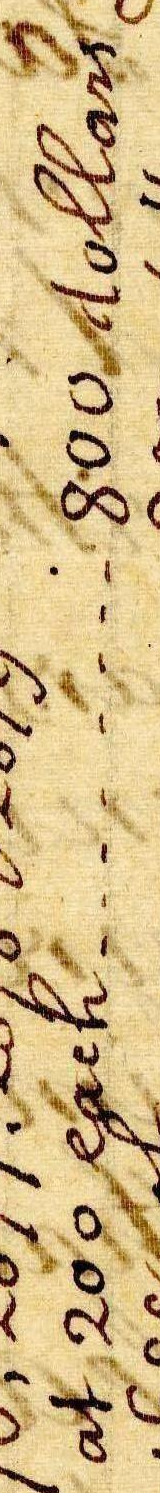at 200 each-------- 800 dollars
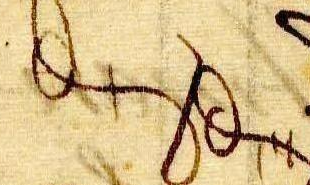£
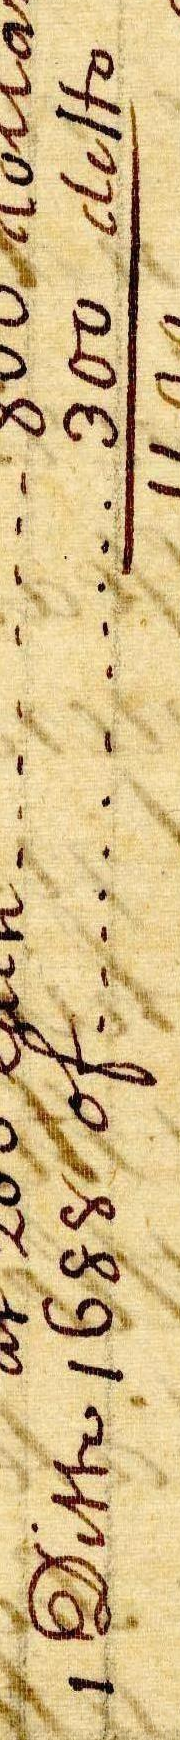1 Ditto 1688 of------------300 ditto
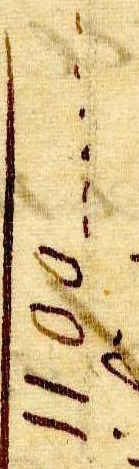1100
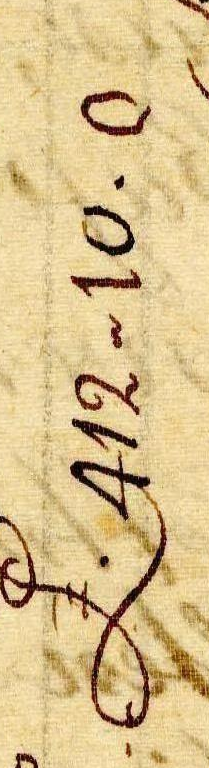£412..10.0
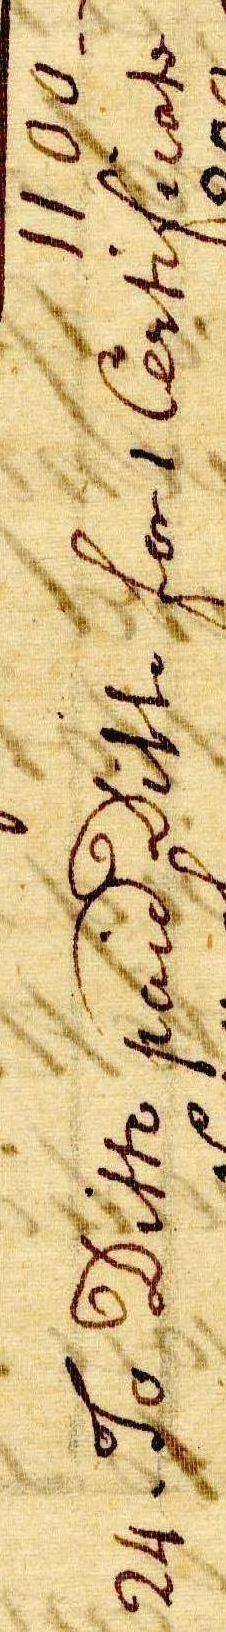24. To Ditto paid Ditto for 1 Certificate
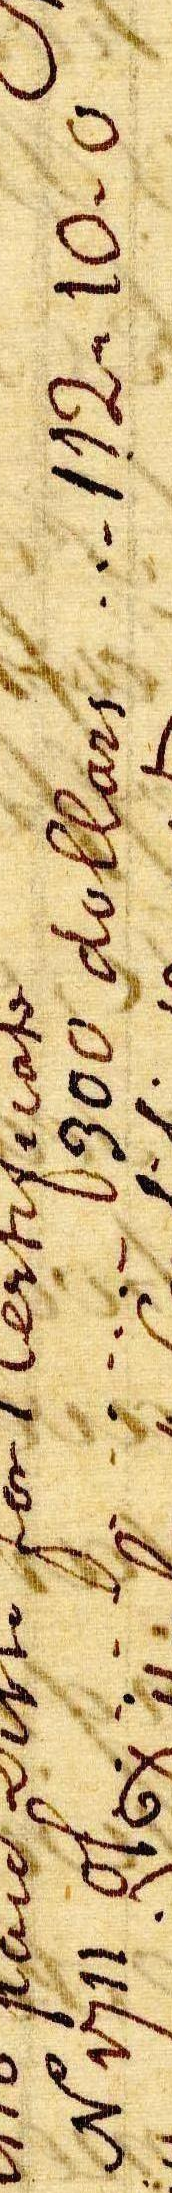N 1711 of ------------300 dollars ---112..10.0
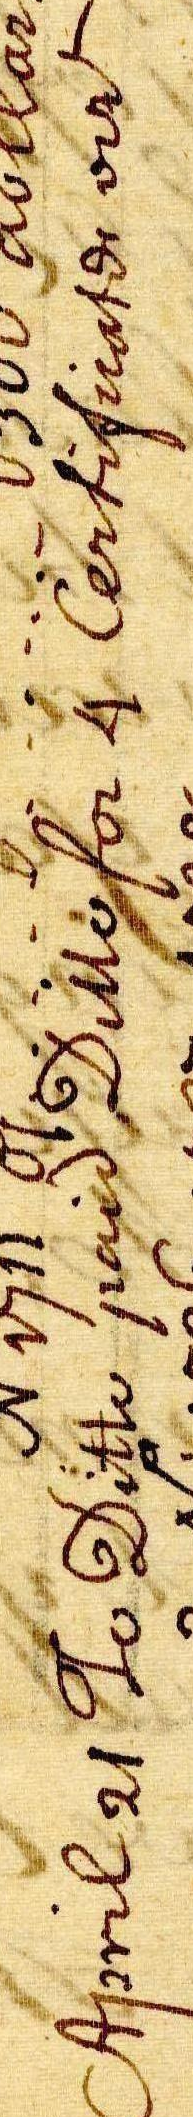April 21 To Ditto paid Ditto for 4 Certificates viz^t
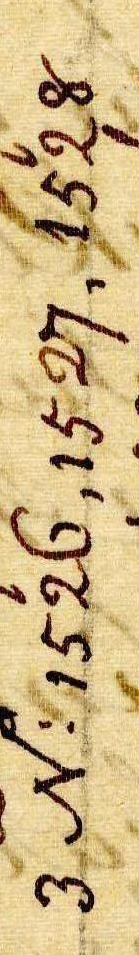3 N^o: 1526, 1527, 1528
